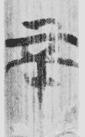不
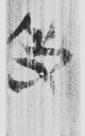及
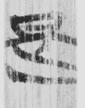是
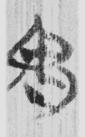胃
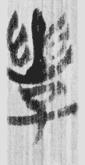{幽子}
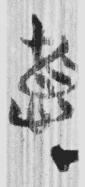惪
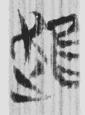𧻚
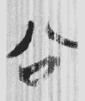公
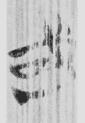或
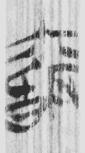{尒䎽}
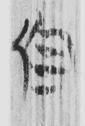於
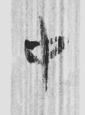中
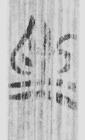爲
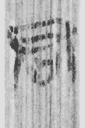君
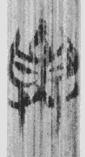與
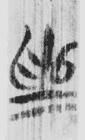爲
